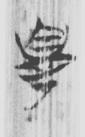辠
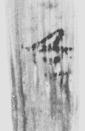隹
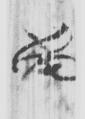民
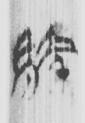{糸亢}
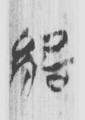{糸己口}
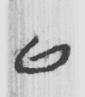㠯（以）
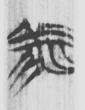羕
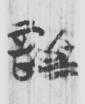{言爲}
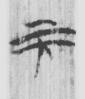天
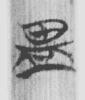昷
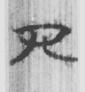四
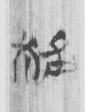{木甫}
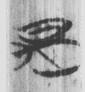是
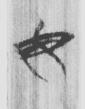母
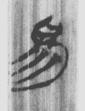易
